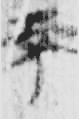不
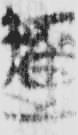𬨭（將）
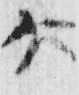大
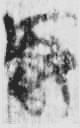○（厩）
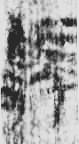馭（御）
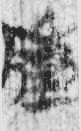○（陳）
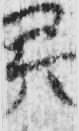己
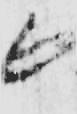㠯（以）
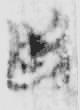○（廷）
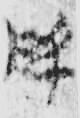阩
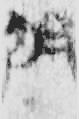門
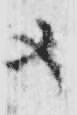又
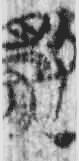敗
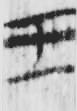王
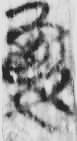婁
